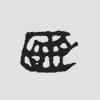匿
